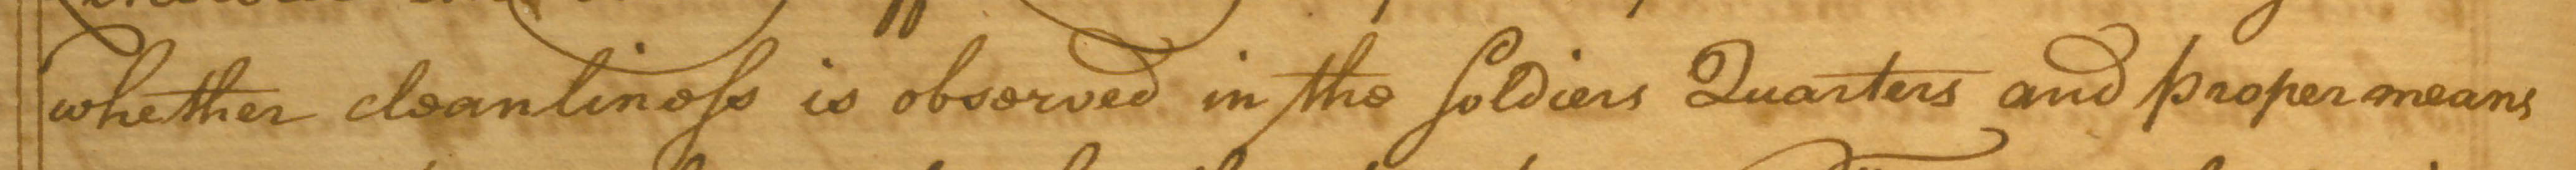whether cleanliness is observed in the soldiers Quarters and proper means
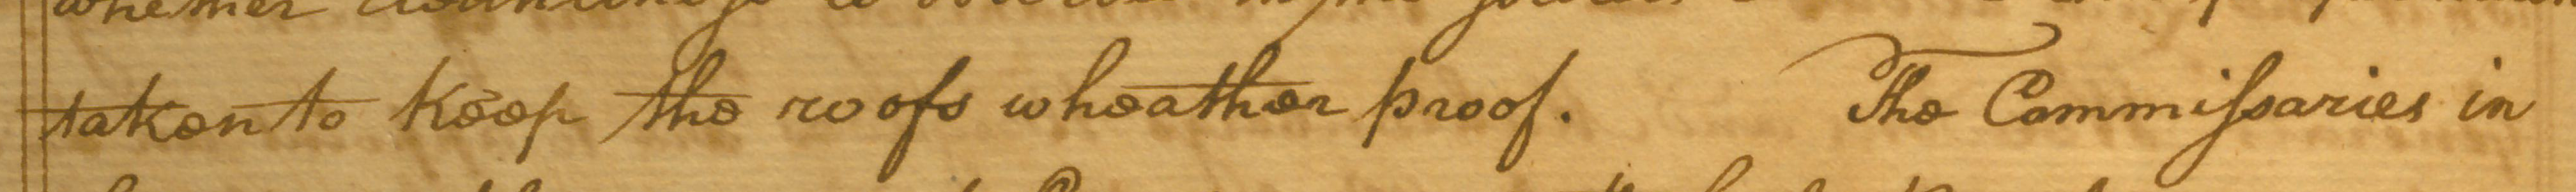taken to keep the roofs wheather proof. The Commissaries in
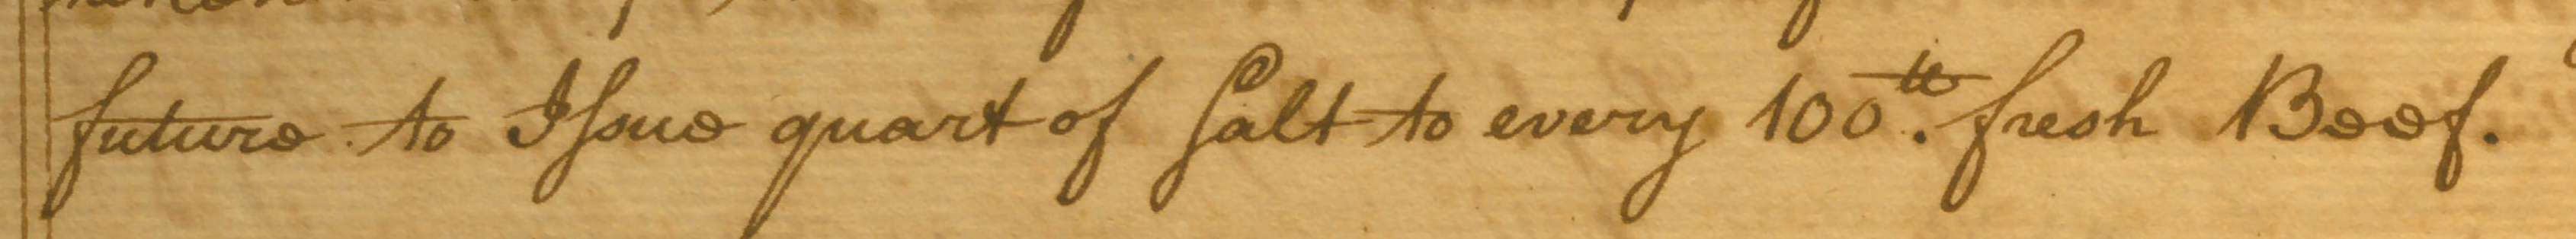future to Issue quart of salt to every 100^lb. fresh Beef.
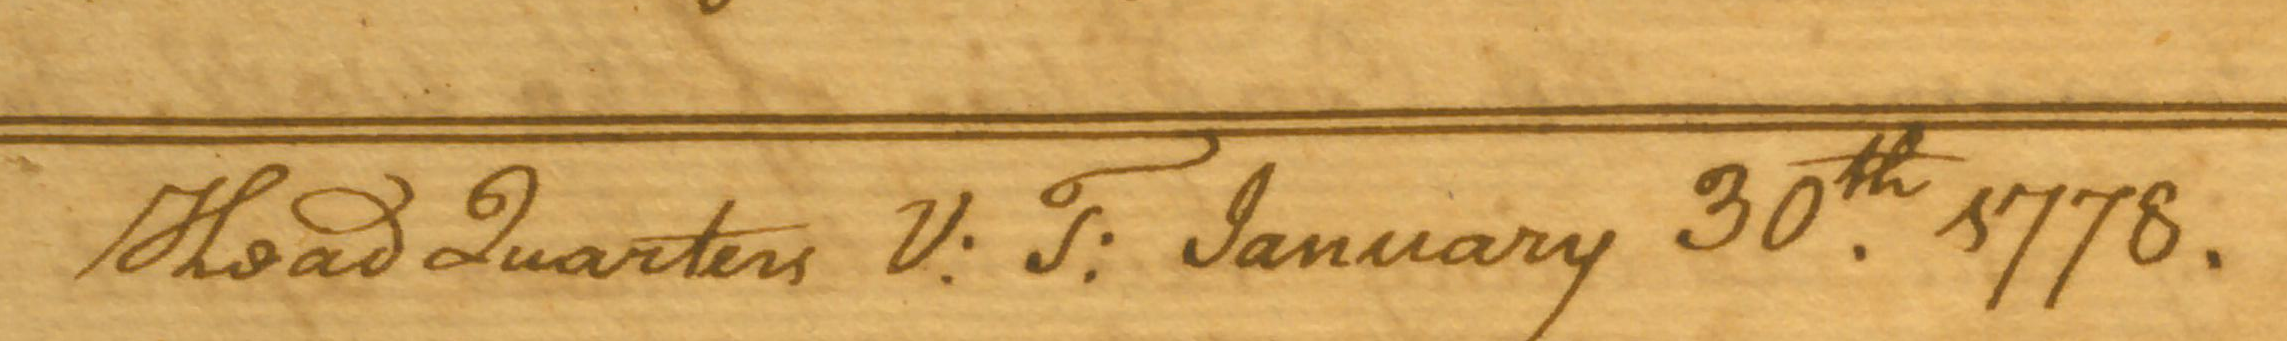Head Quarters V: F: January 30^th. 1778.
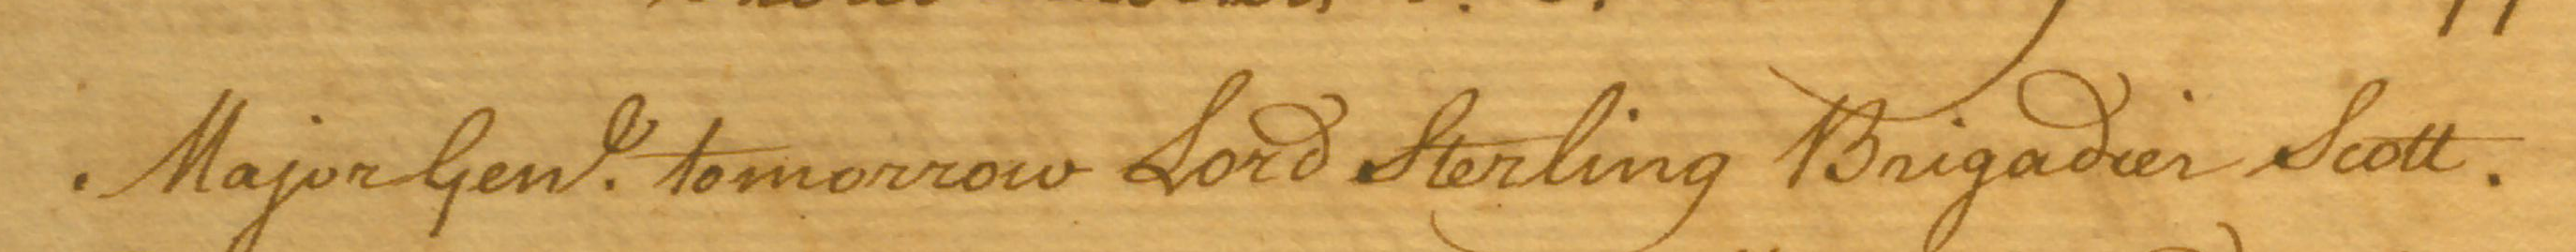Major Gen^l. tomorrow Lord Sterling Brigadier Scott.
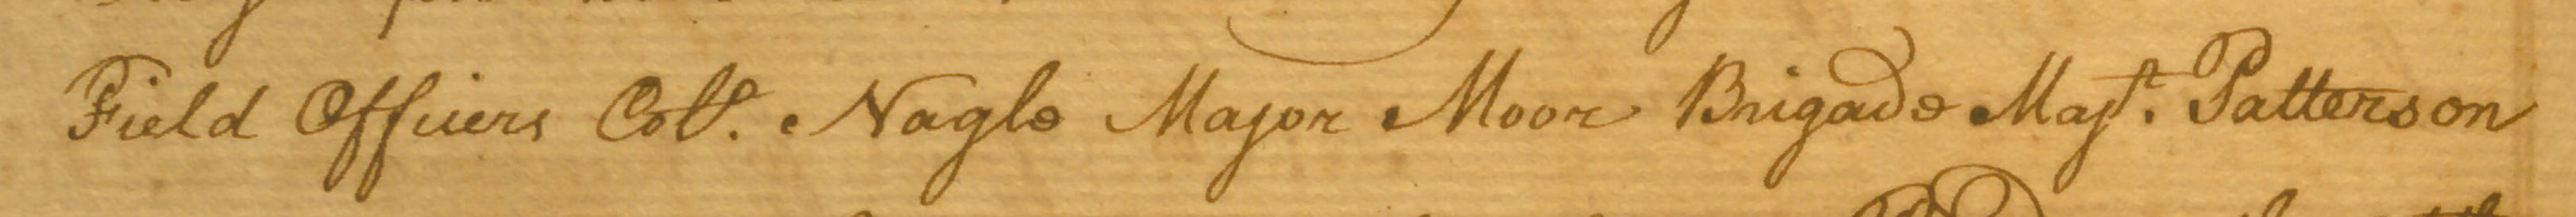Field Officers Col^o. Nagle Major Moor Brigade Maj^r. Patterson
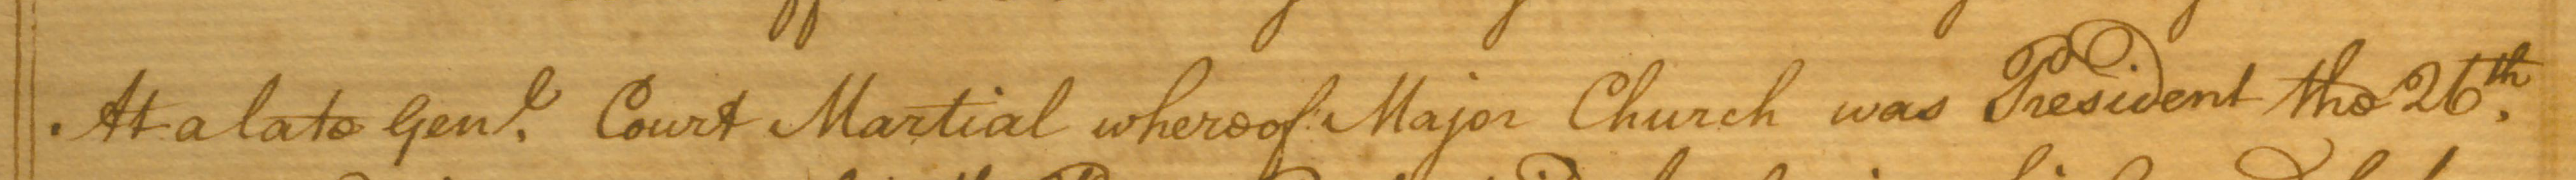At a late Gen^l. Court Martial whereof Major Church was President the 26^th.
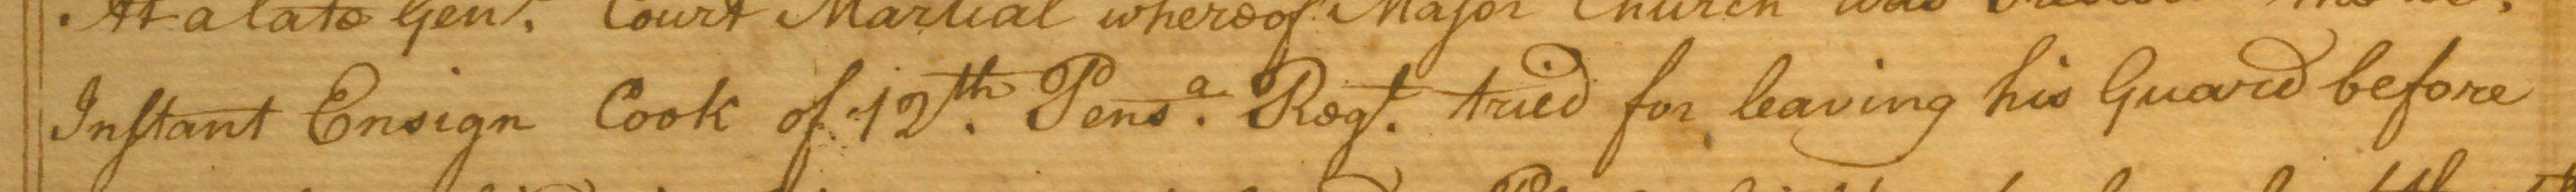Instant Ensign Cook of the 12^th. Pens^a. Reg^t. tried for leaving his Guard before
